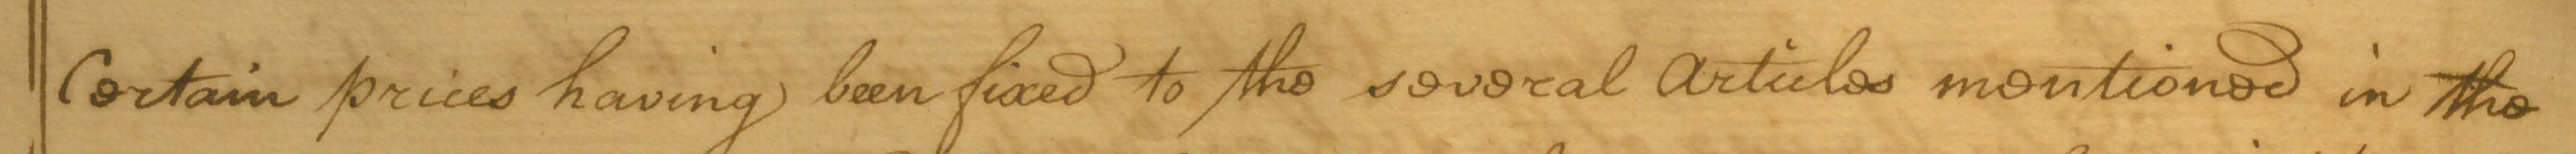Certain prices having been fixed to the several Articles mentioned in the
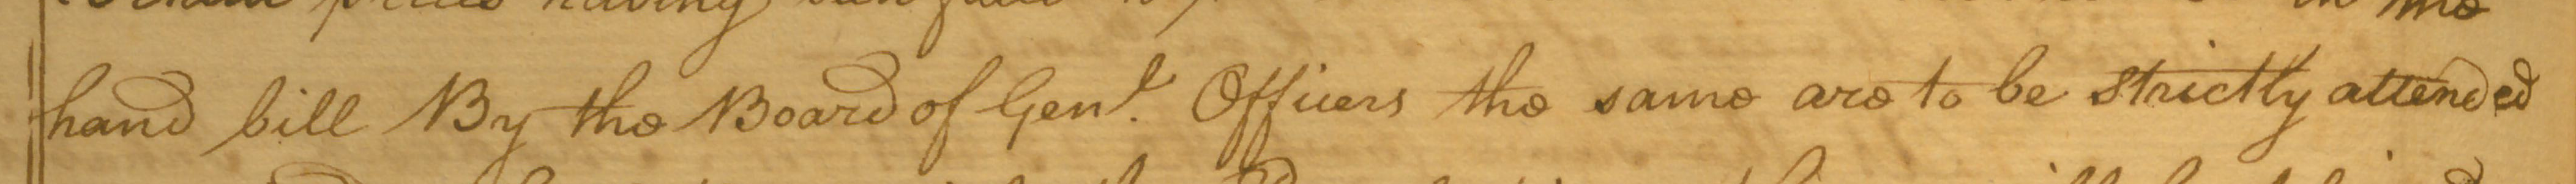hand bill By the Board of Gen^l. Officers the same are to be strictly attended
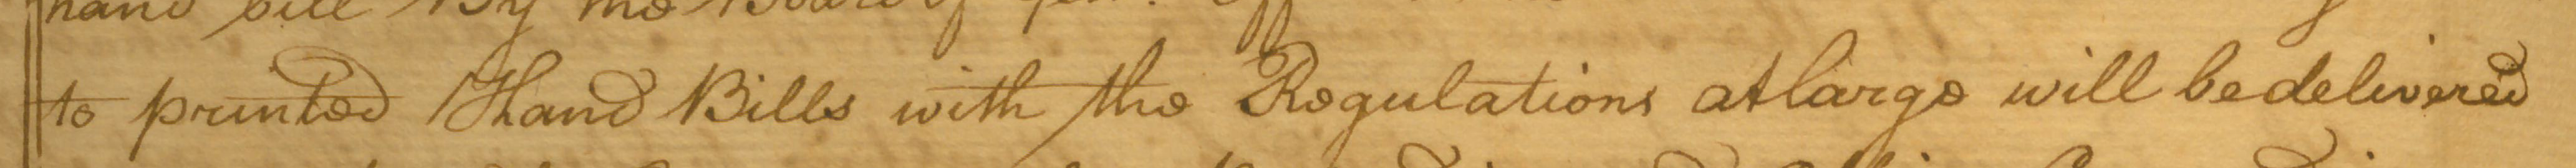to printed Hand Bills with the Regulations at large will be delivered
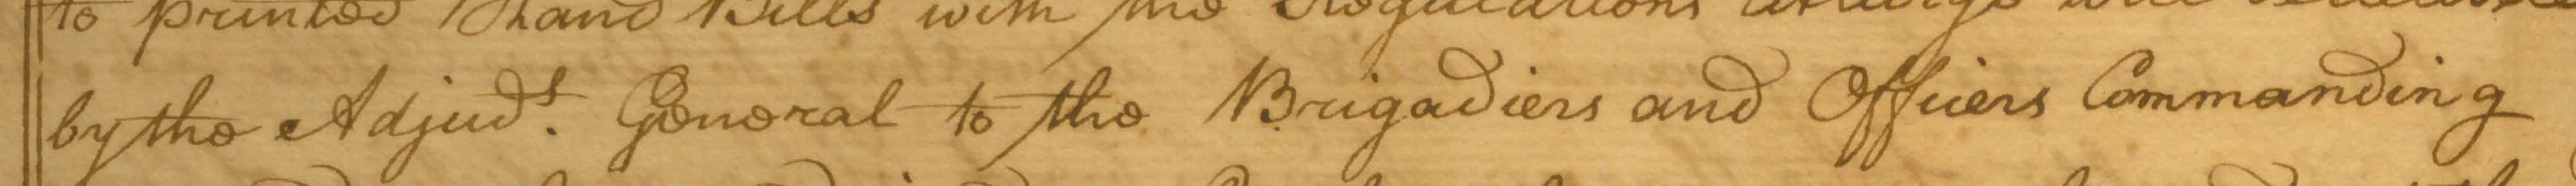by the Adjud^t. General to the Brigadiers and Officers Commanding
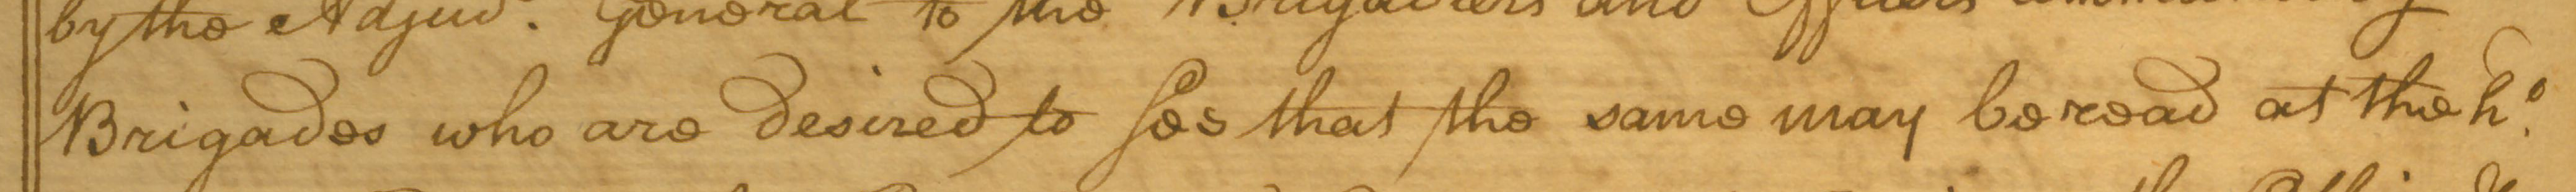Brigades who are desired to see that the same may be read at the h^d.
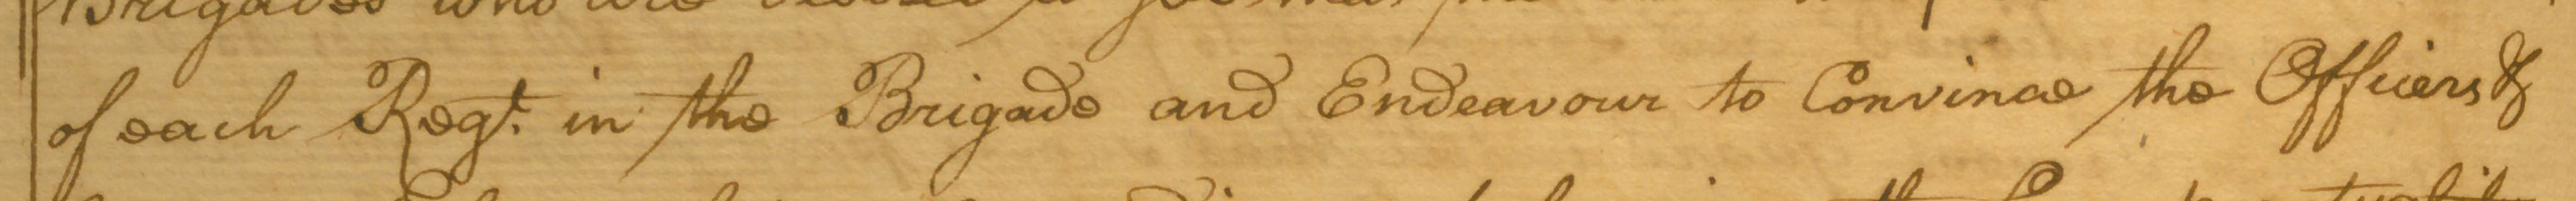of each Reg^t. in the Brigade and Endeavour to Convince the Officers &
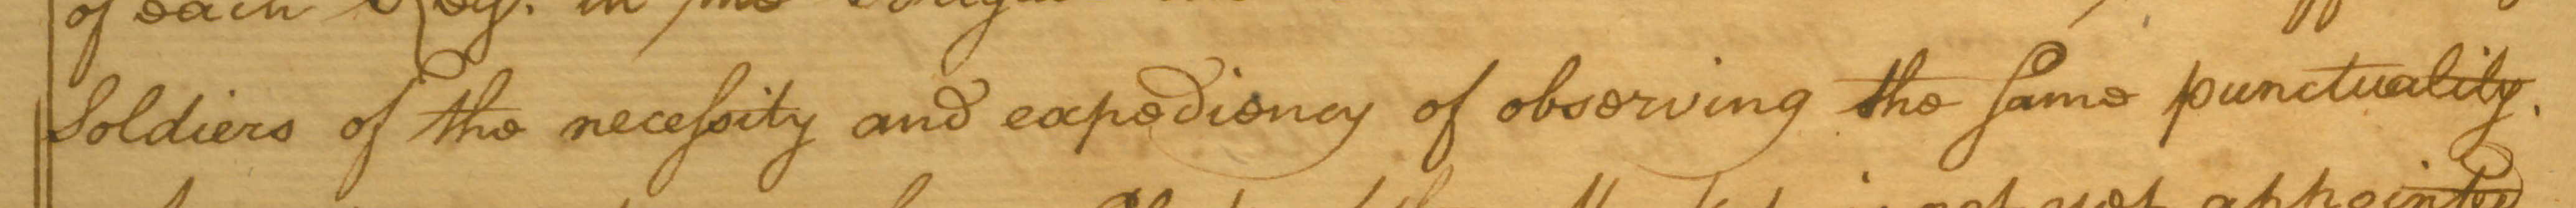Soldiers of the necessity and expediency of observing the same punctuality.
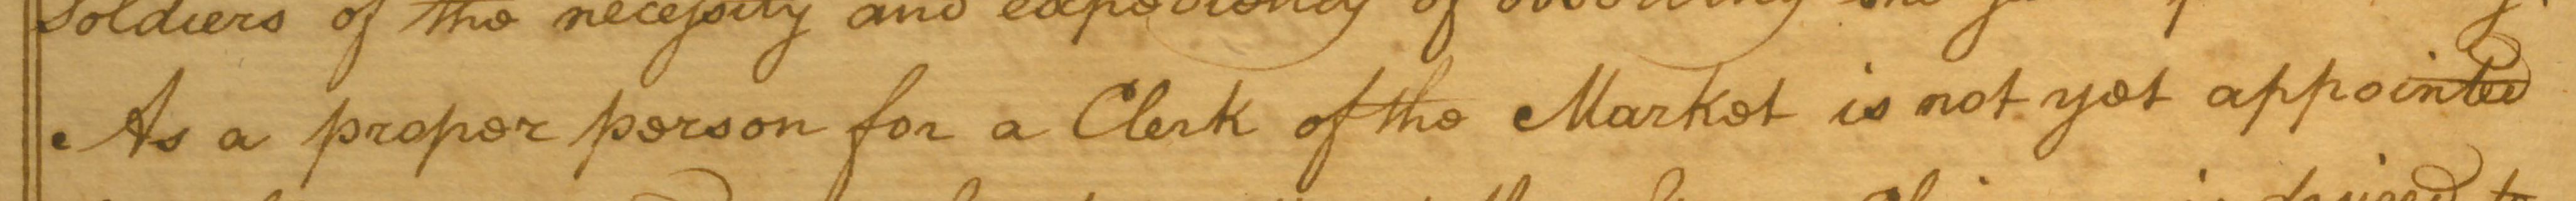As a proper person for a Clerk of the Market is not yet appointed
